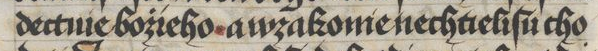dectuie bożíeho.a wzakonie nechtieliſu cho¬
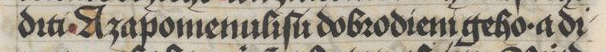diti.A zapomenuliſu dobrodieni geho.a di¬
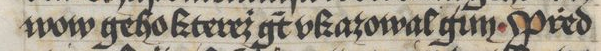wow geho ktereż ḡt okazowal gim.Pṙed
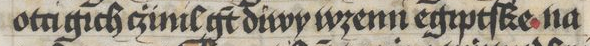otci gich cżinil ḡt diwy wzemi egiptſke.na
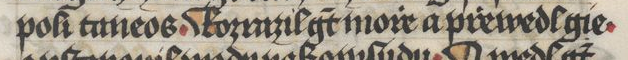poli taneos.Rozrazil ḡt moṙe a pṙewedl gíe.
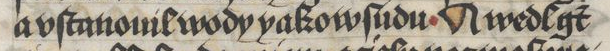a vſtanouil wody yakowſudu.A wedl ḡt
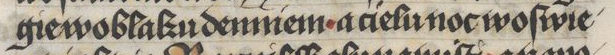gie woblaku denniem.a cielu noc woſwie¬
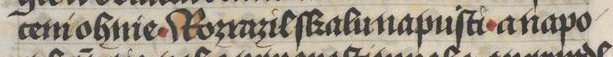cení ohnie.Rozrazil ſkalu na puẛti.a napo¬
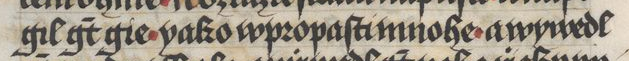gil ḡt gie.yako wpropaſti mnohe.awywedl
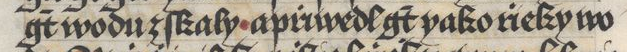ḡt wodu zſkaly.apṙiwedl ḡt yako ṙieky wo¬
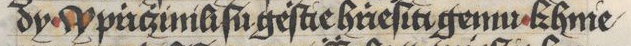dy.Y pṙicżinil ſu geẛtie hṙieſiti gemu.khnie¬
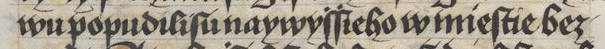wu popudiliſu naywyẛẛieho w mieſtie bez¬
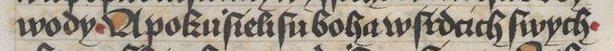wody.A pokuẛieliſu boha wſrdcich ſwych.
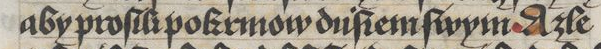aby proſili pokrmow duẛiem ſwym.A zle
